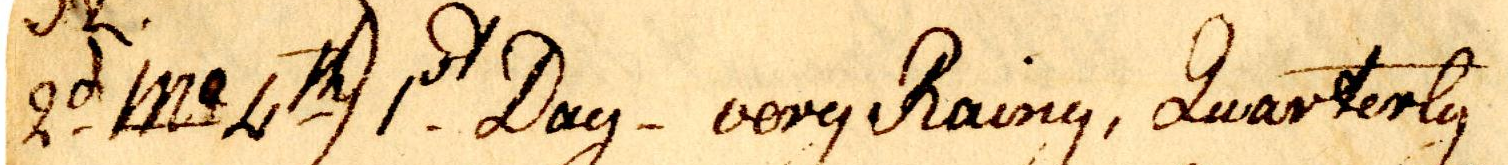2^d M^o 4^th) 1^st Day- very Rainy, Quarterly
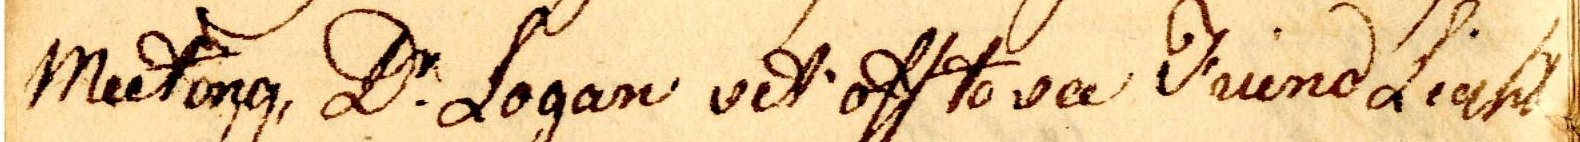Meeting, D^r. Logan set off to see Friend Light
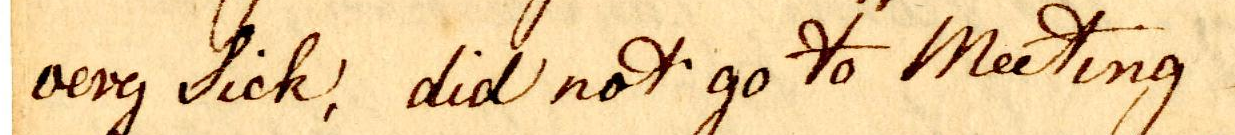very Sick, did not go to Meeting
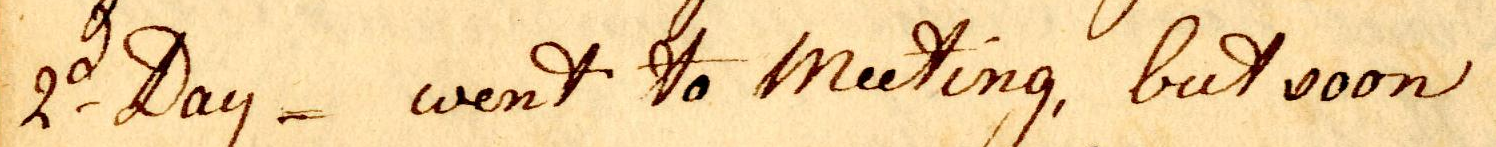2^d Day- went to Meeting, but soon
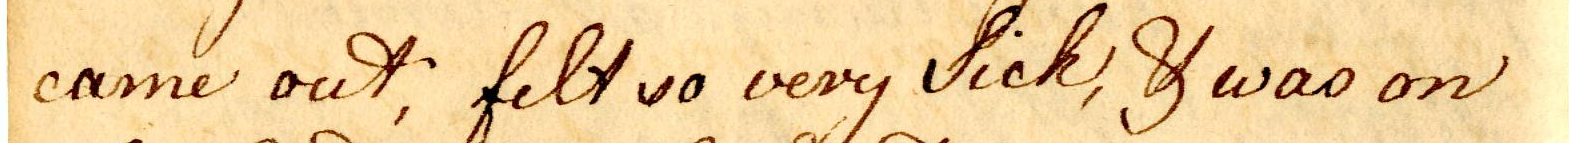came out, felt so very Sick, & was on
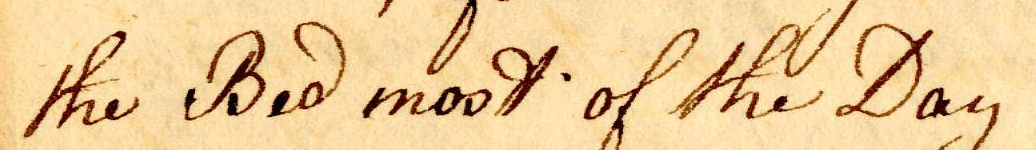the Bed most of the Day
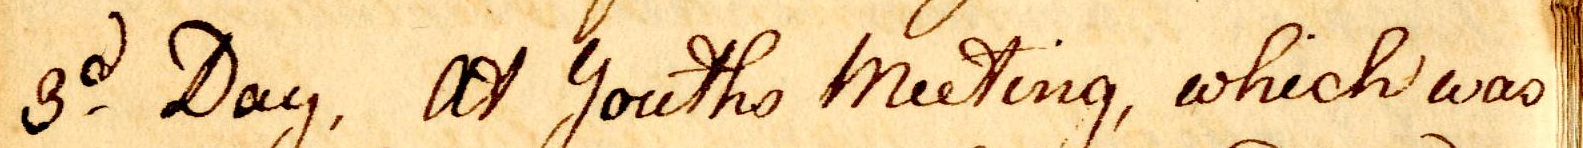3^d- Day. At Youths Meeting, which was
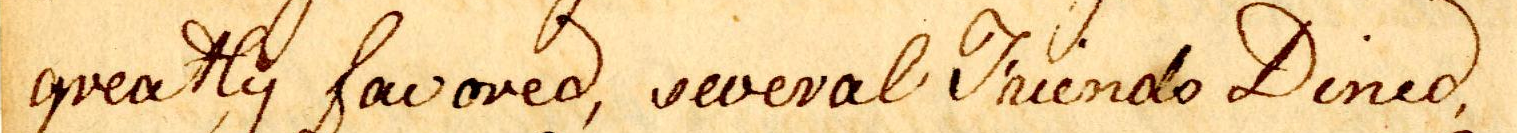greatly favored, several Friends Dined,
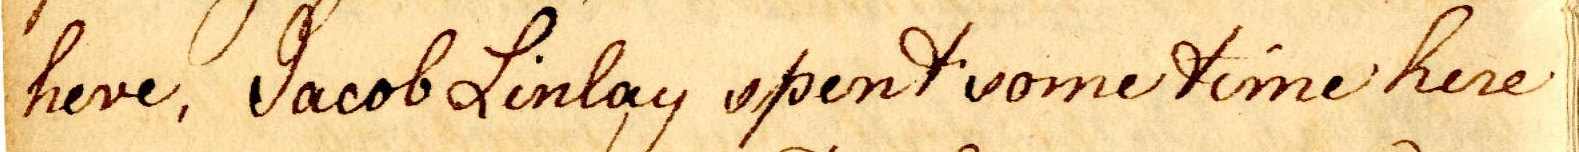here, Jacob Linlay spent some time here
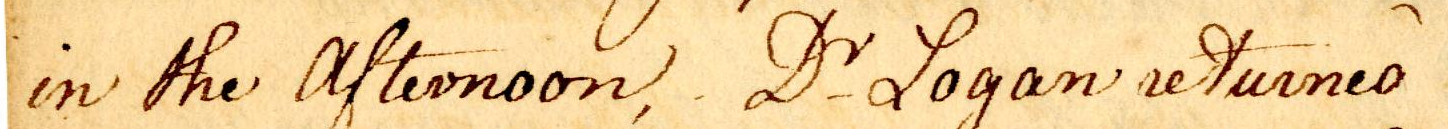in the Afternoon, D^r- Logan returned
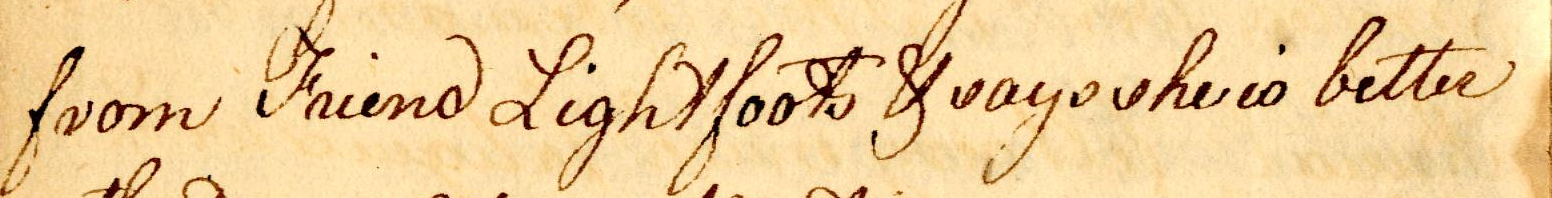from Friend Lightfoots & says she is better
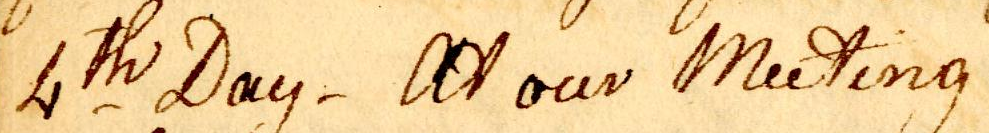4^th Day- At our Meeting
